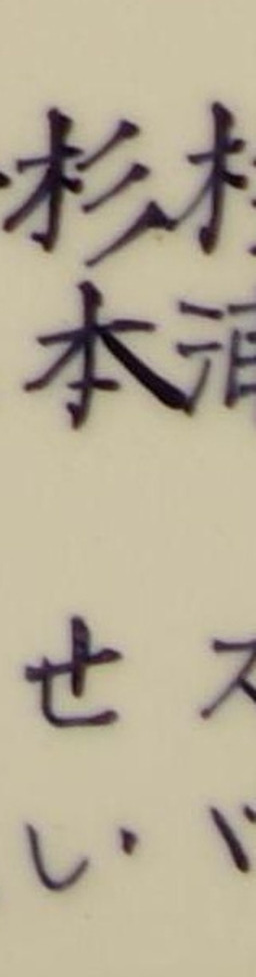杉本せい
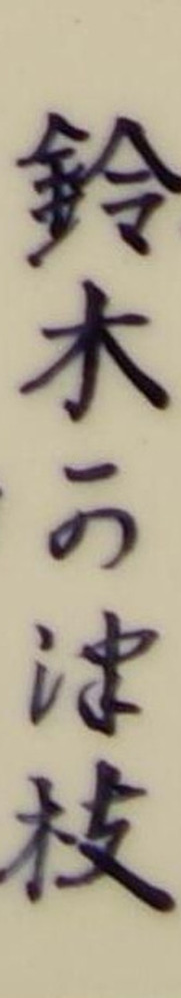鈴木かつえ
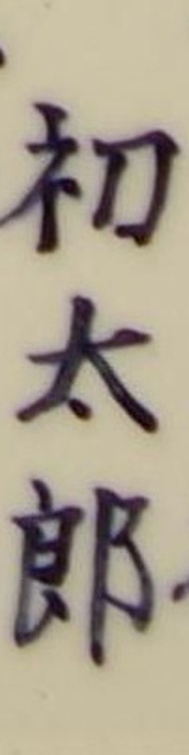初太郎
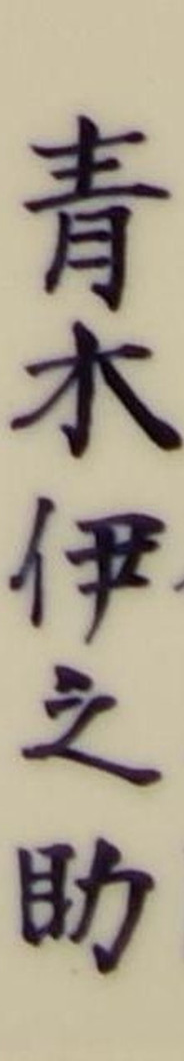青木伊之助
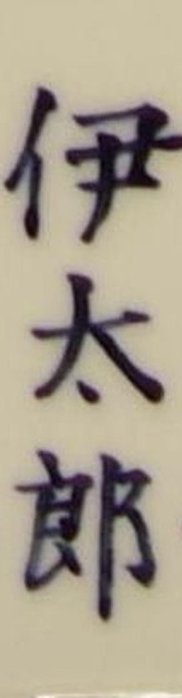伊太郎
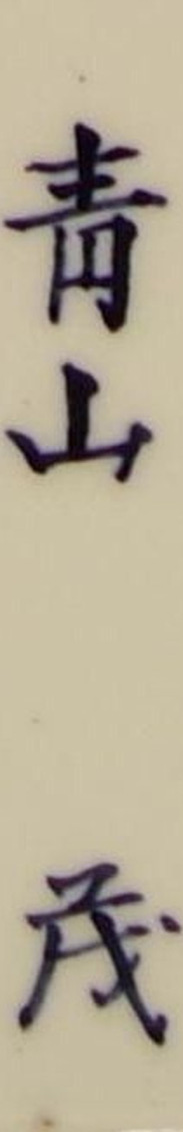青山茂
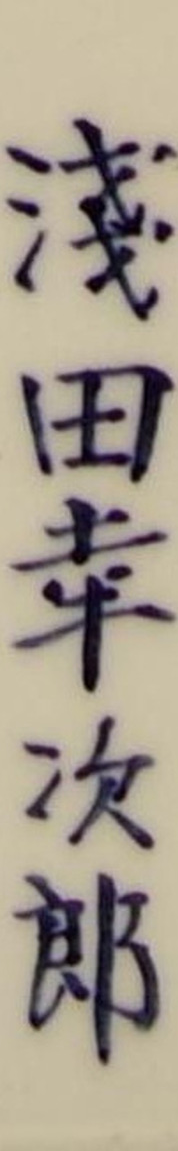浅田幸次郎
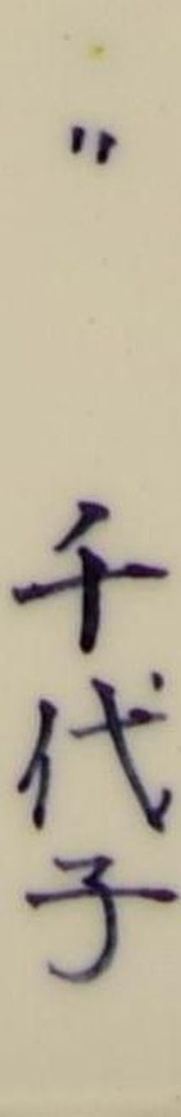千代子
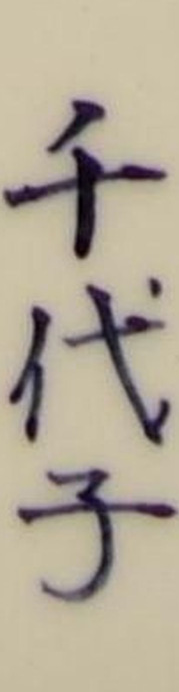千代子
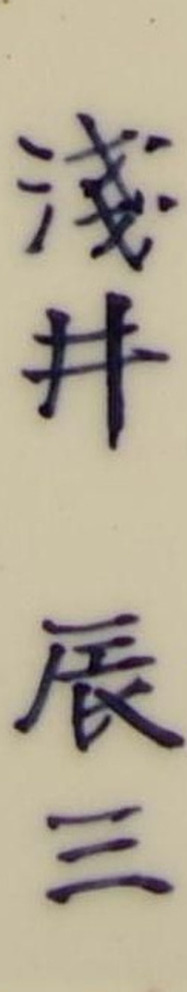浅井辰三
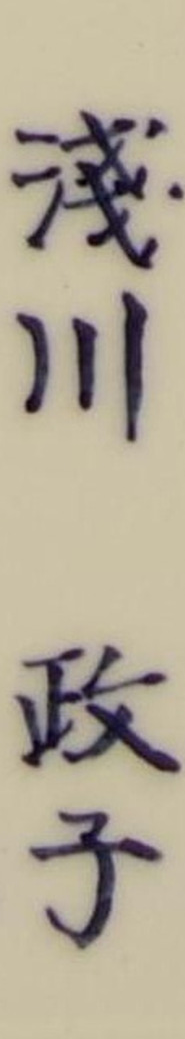浅川政子
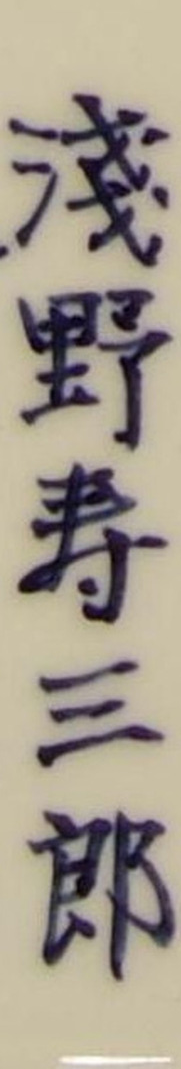浅野寿三郎
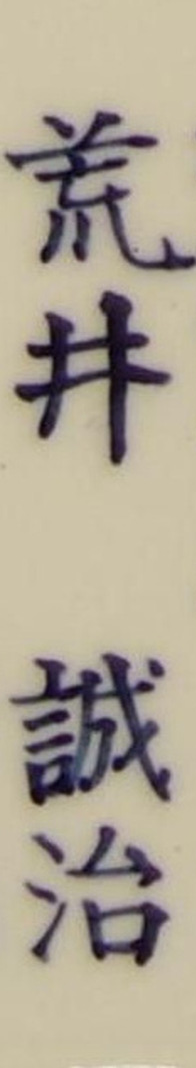荒井誠治
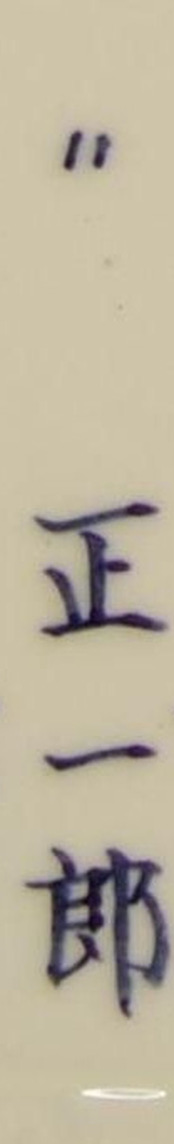正一郎
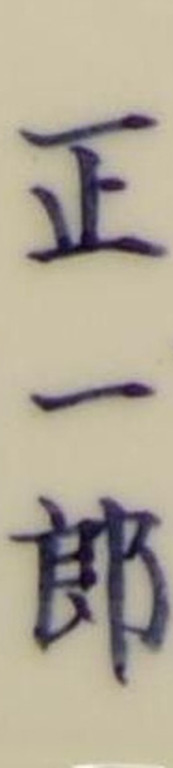正一郎

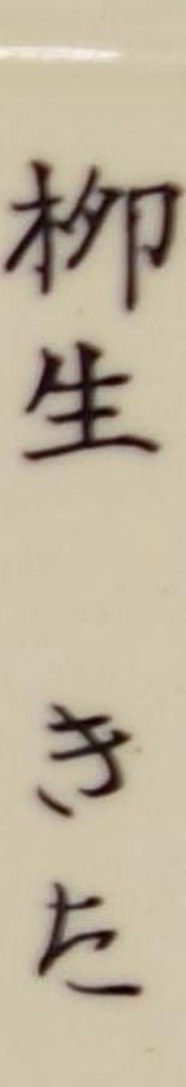柳生きた
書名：E~L
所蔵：高野山金剛峯寺
